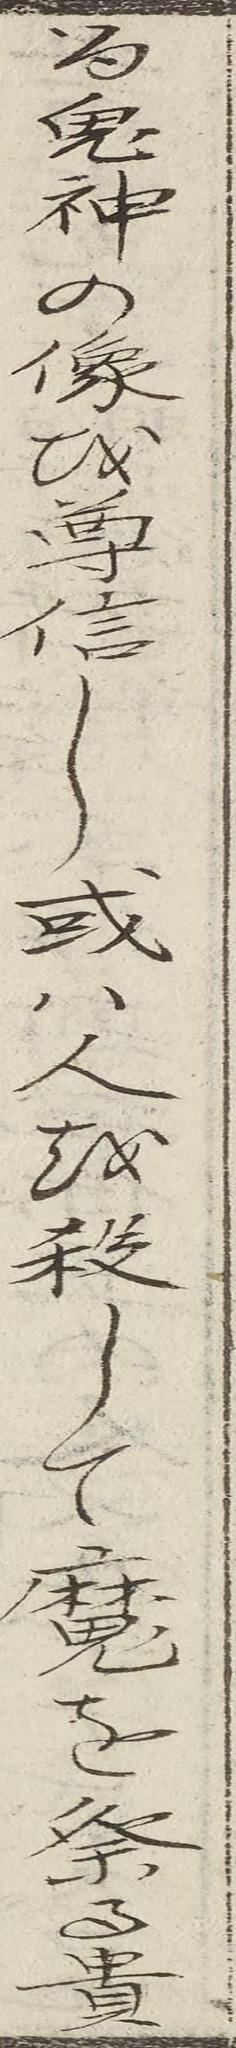る鬼神の像を尊信し或ハ人を殺して魔を祭る貴
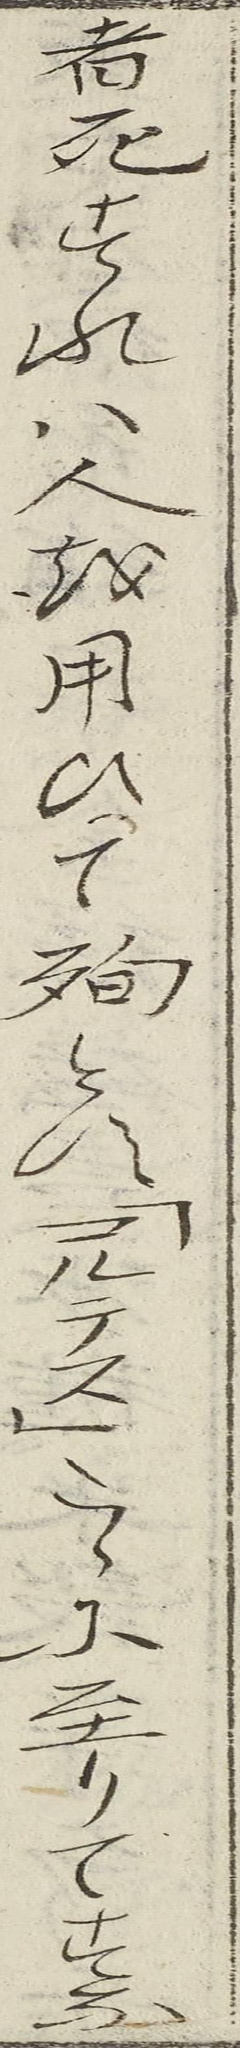者死すれハ人を用ひて殉とす「コルテス」こゝに至りてすな
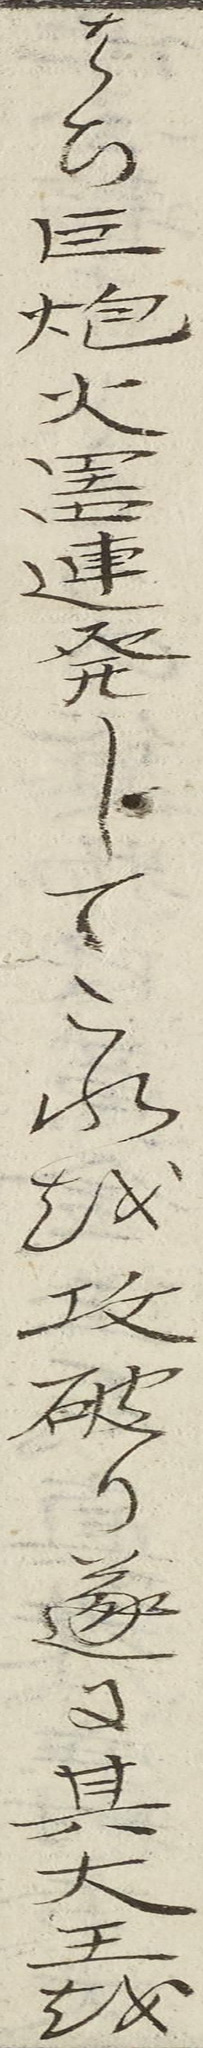はち巨砲火器連発してこれを攻破り遂に其大王を
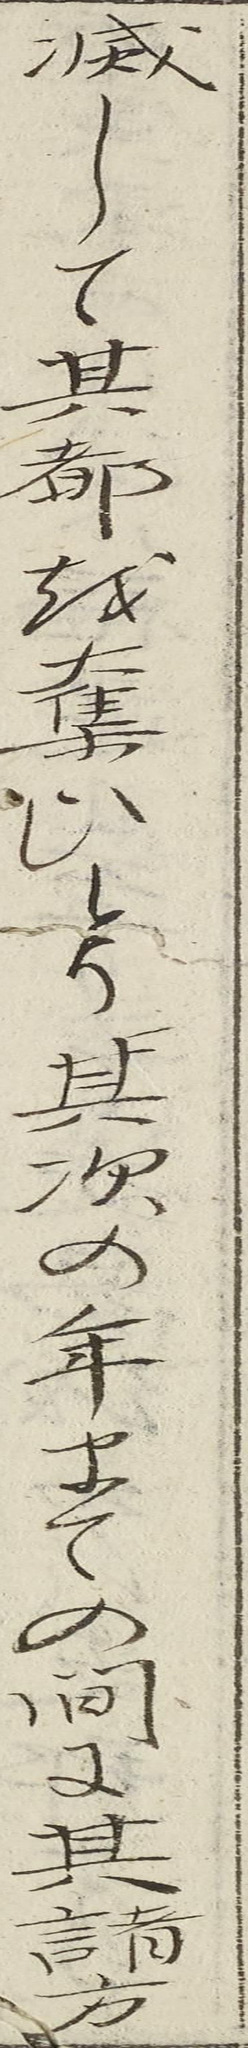滅して其都を奪ひとり其次の年まての間に其諸方
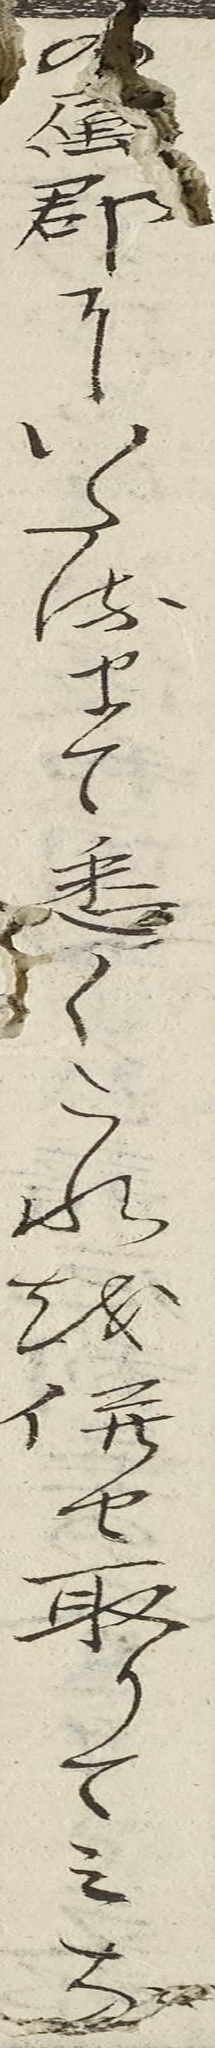の属郡にいたるまて悉くこれを併せ取りてミな
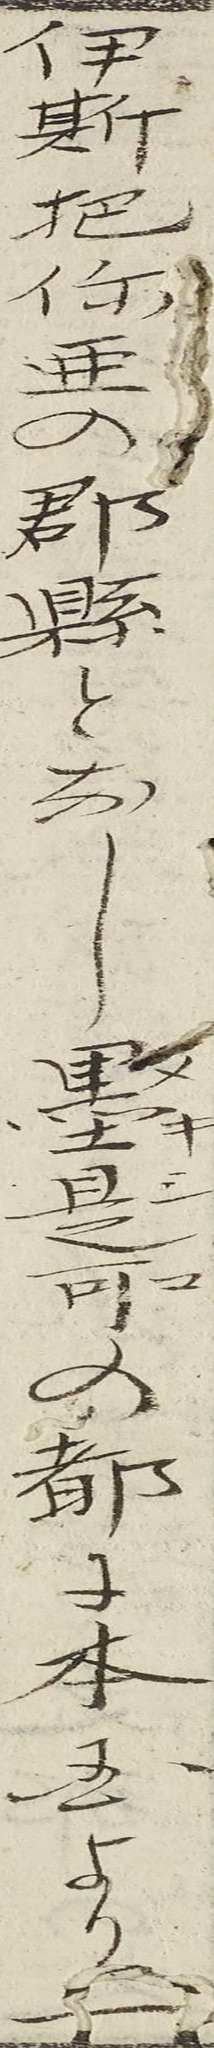伊斯把你亜の郡県となし墨是可の都に本国より一
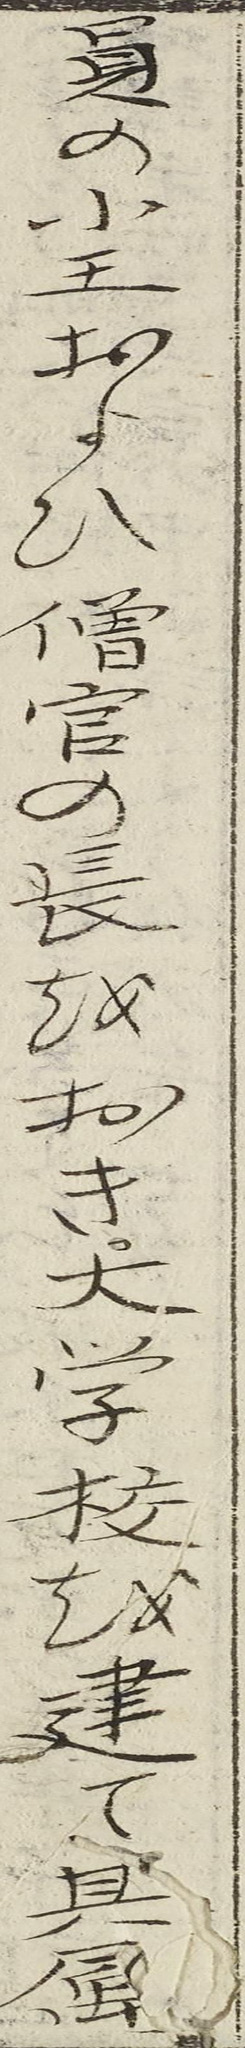員の小王およひ僧官の長をおき大学校を建て其の属
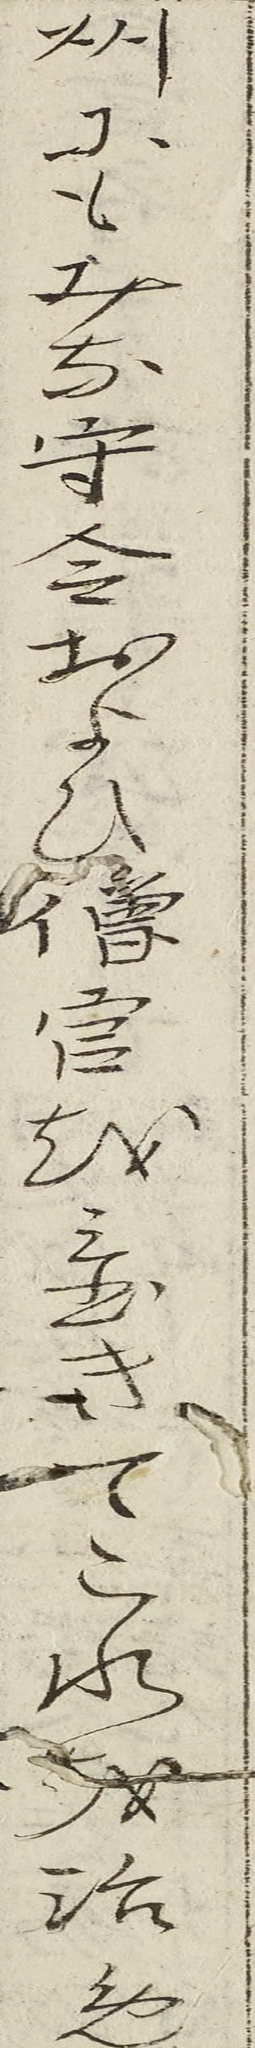州にもミな守令およひ僧官を置きてこれを治め
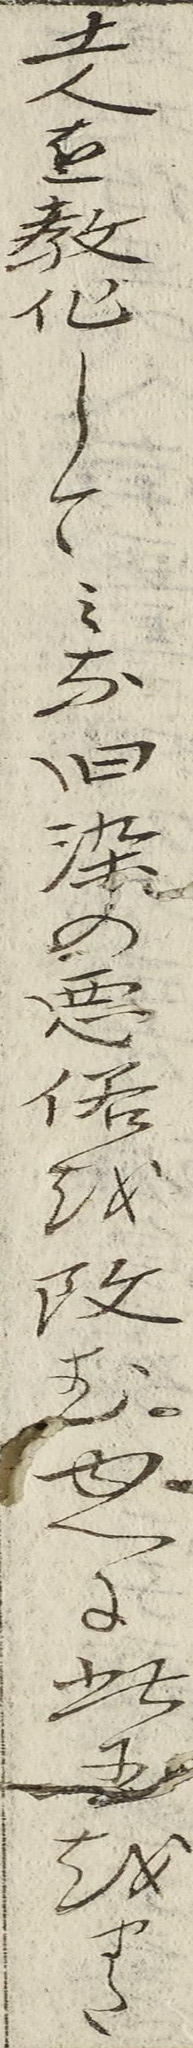土人を教化してミな旧染の悪俗を改むゆへに此国をまた
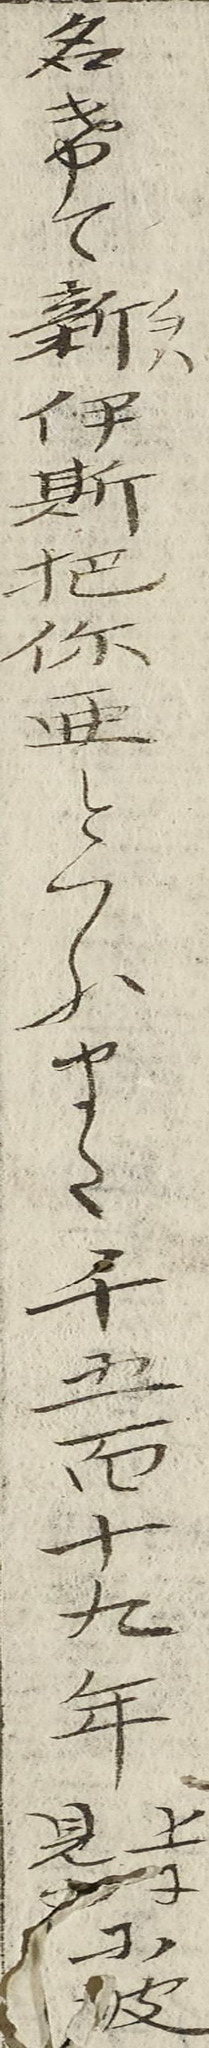名けて新伊斯把你亜といふまた千五百十九年上に見ゆに波
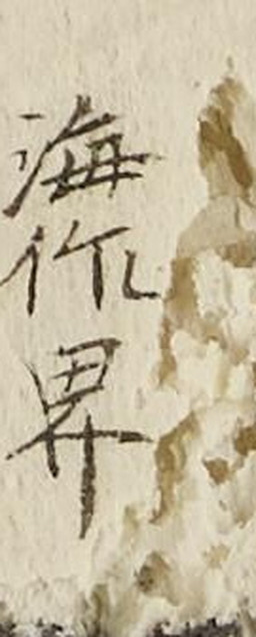海作界
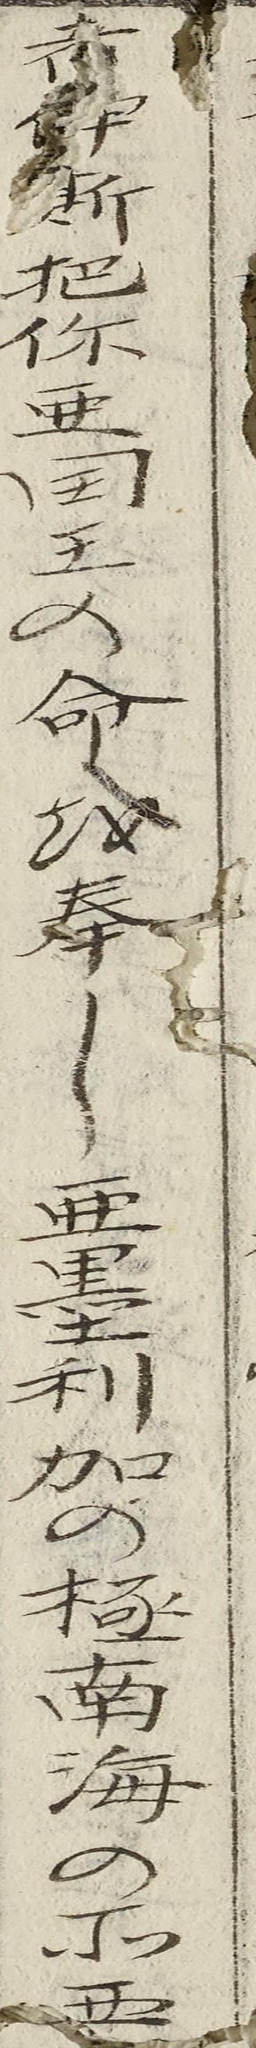者伊斯把你亜国王の命を奉し亜墨利加の極南海の所西
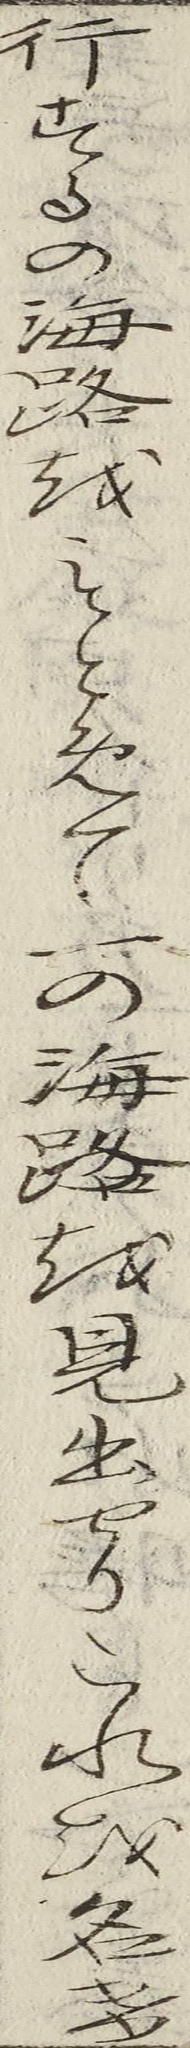往するの海路をもとめてもとめて一の海路を見出せりこれを名け
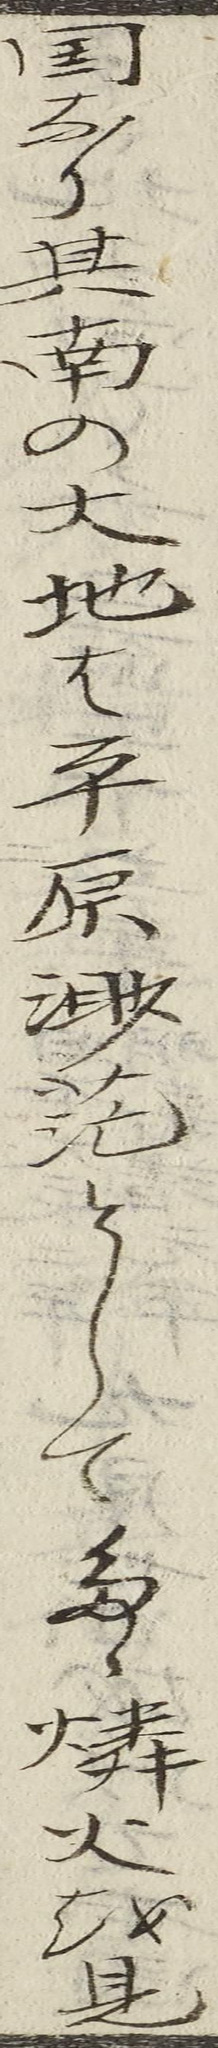国なり其南の大地は平原渺茫としてたゝ燐火を見
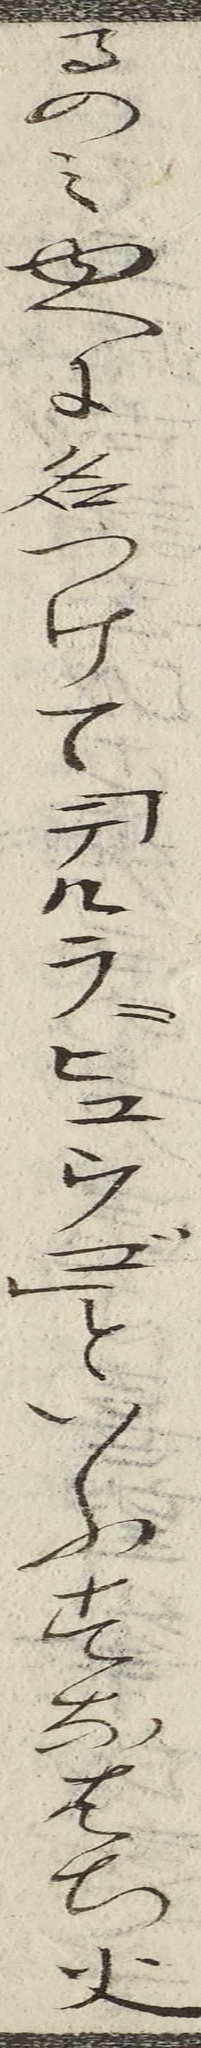るのミゆへに名つけて「テルラ。ヒュゴ」といふすなはち火

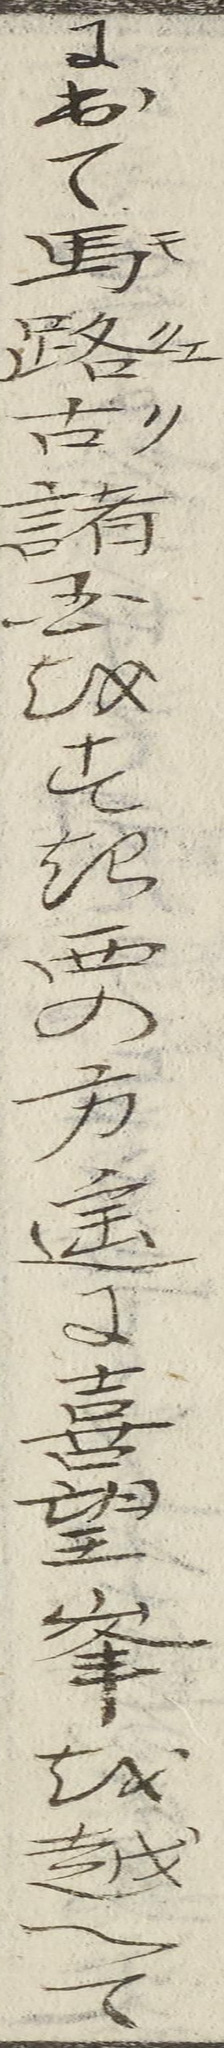に出て馬路古諸国をすき西の方遥に喜望峯を越へて
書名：西洋雜記　乾
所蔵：東京大学地震研究所図書室 Earthquake Research Institute Library, The University of Tokyo, JAPAN
